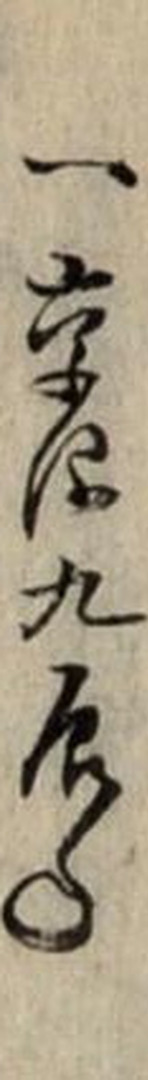一享保九辰年
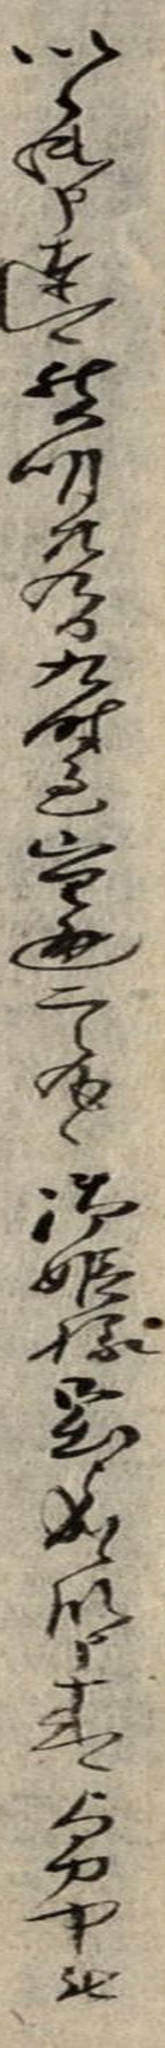以手紙申達候然は明廿九日九時過山里通二之丸へ御姫様御出被成候段申来候与力中被
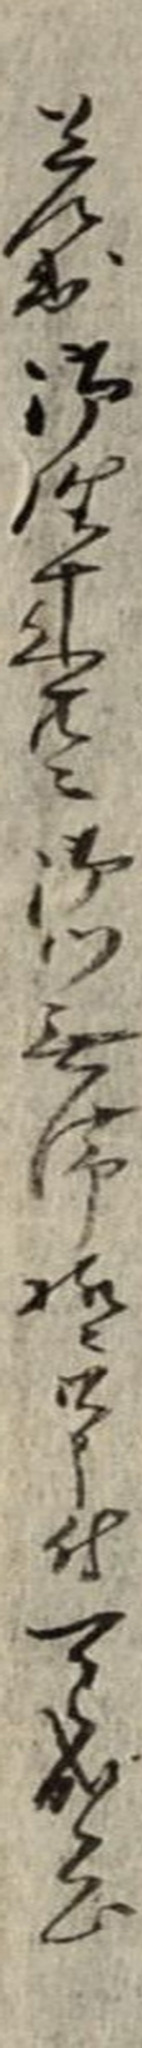差出御往来共に御門無滞様に被申付可被成候以上
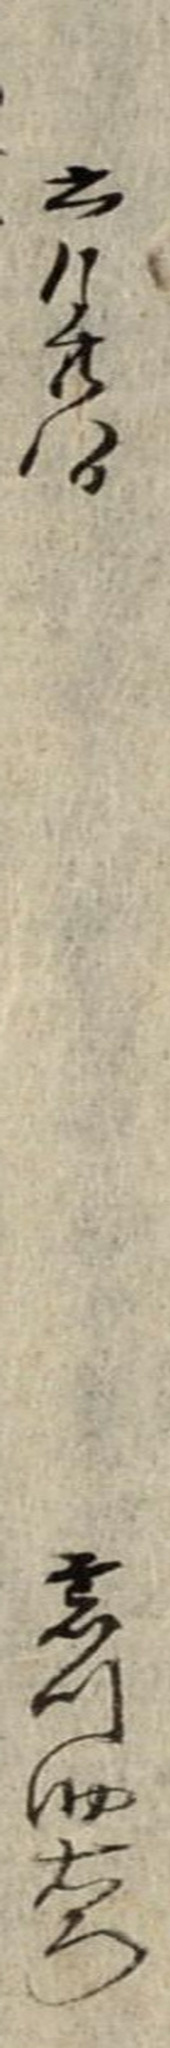六月廿八日荒川助右衛門
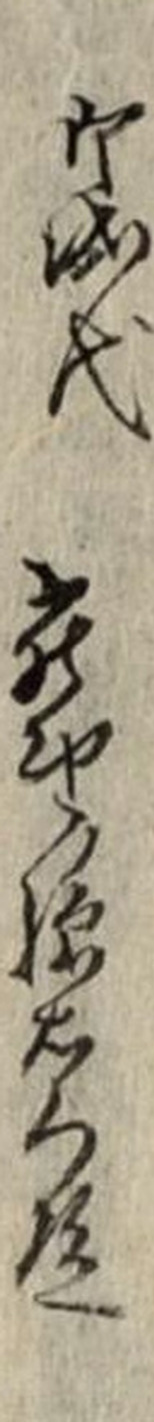御城代荻野孫右衛門殿
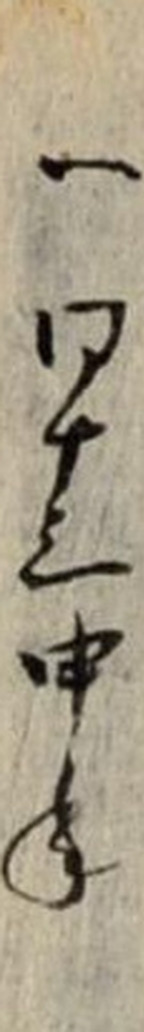一同十三申年
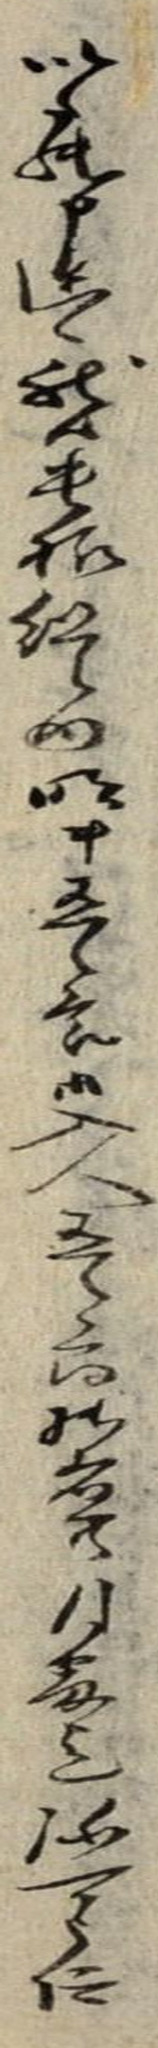以手紙申達候然は貴様組之内明き有之節御入人有之候間拙者共月番迄弥可被仰
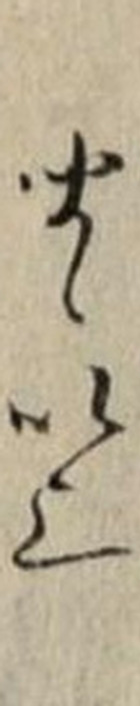聞候以上
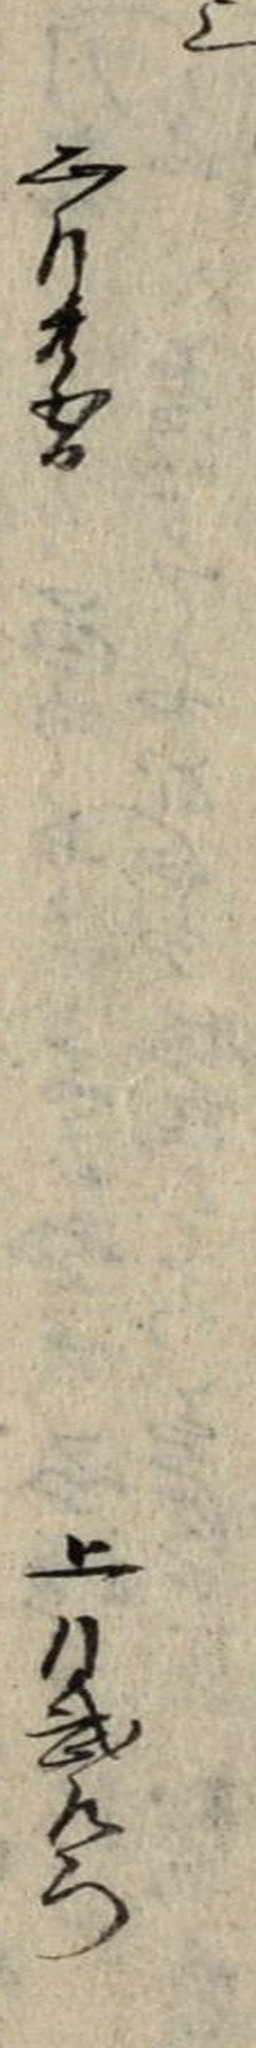正月廿五日上月武左衛門
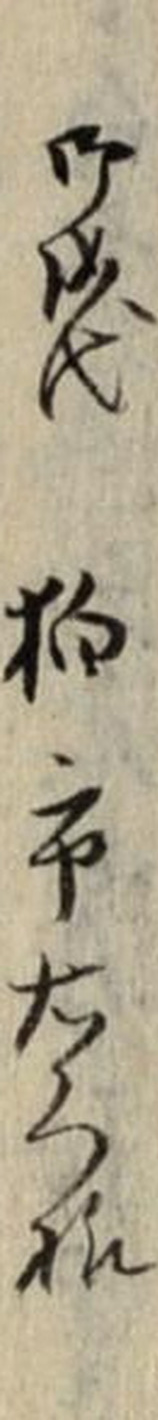御城代狛市右衛門様
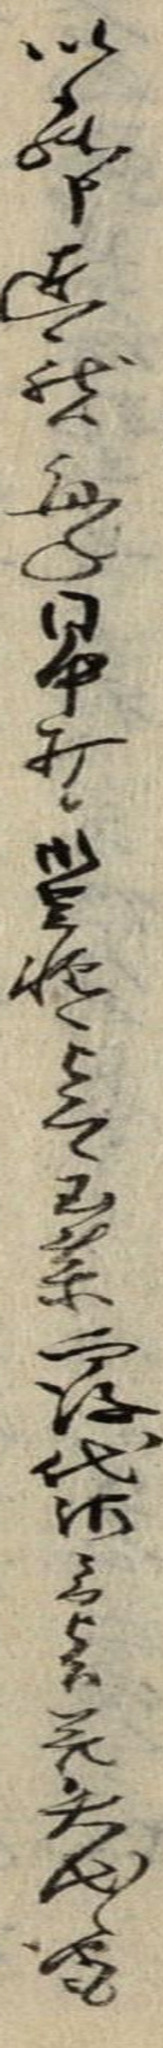以手紙申達候然は毎年日中折々御足軽へ被下候玉薬向後代銀に而被下并右代之儀も
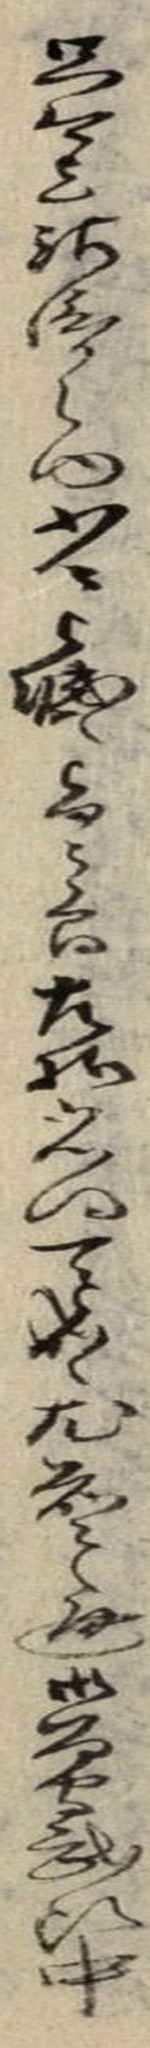只今迄銀渡之内少々被減候旨候間左様御心得可成被候尤前々之通御留守武頭中
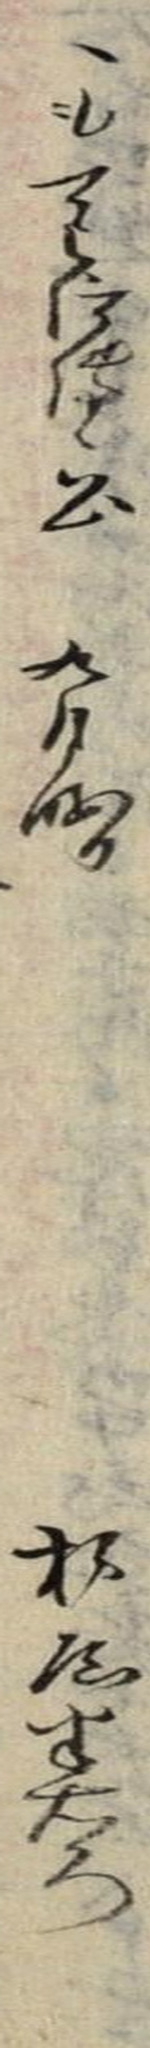へも可被仰伝候以上九月晦日栃屋半右衛門
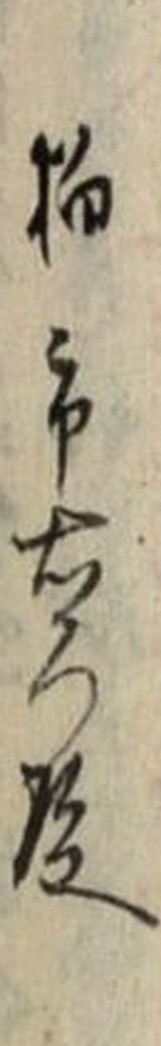同狛市右衛門殿
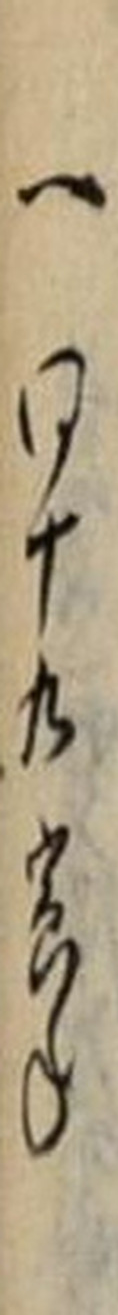一同十九寅年
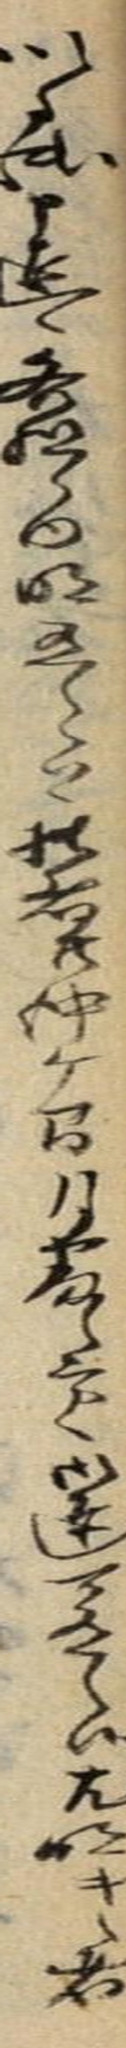以手紙申達候各組之内明有之候はゝ拙者共仲ヶ間月番之方へ御達可有之候尤明き之者
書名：蒐輯之部
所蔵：福井県文書館 Fukui Prefectural Archives
